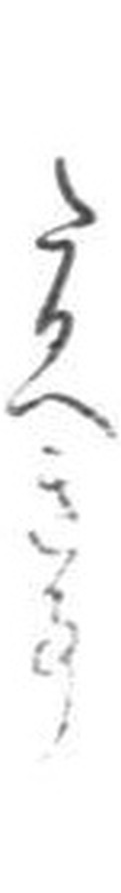たるへき事
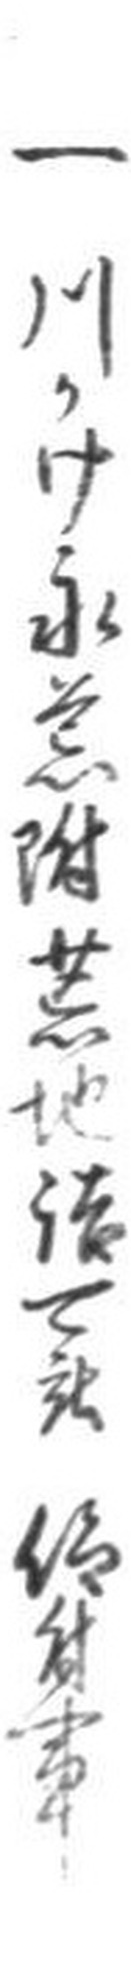一川かけ永荒附荒地詰可被仰付事

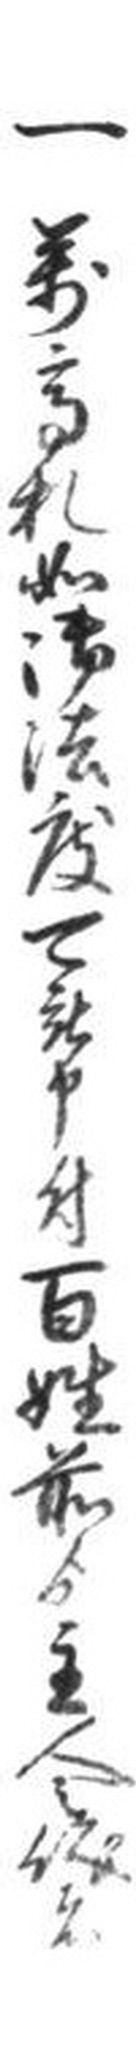一万高札如御法度可被申付百姓前ゟ主人之儀は
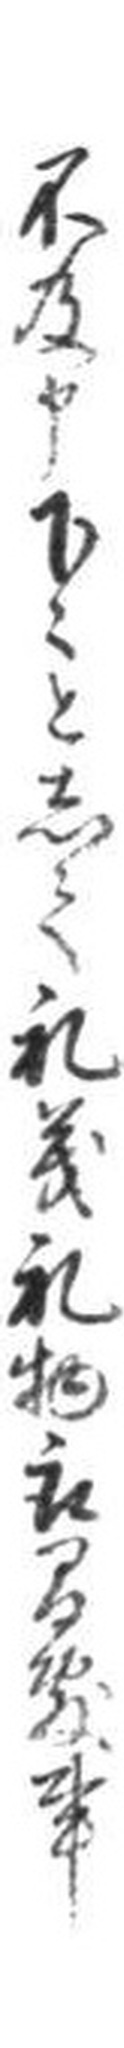不及申下々として礼義礼物取間敷事
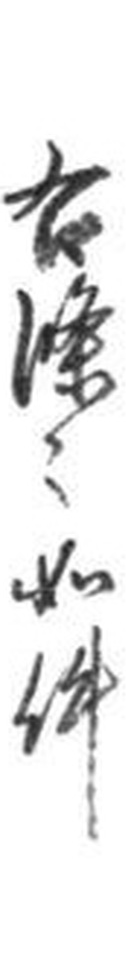右条々如件
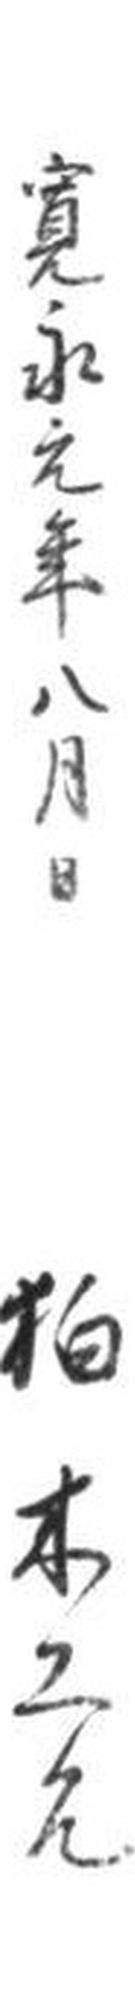寛永元年八月日狛木工允
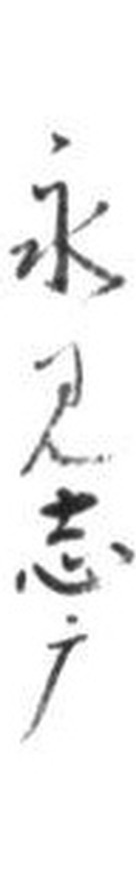永見志摩
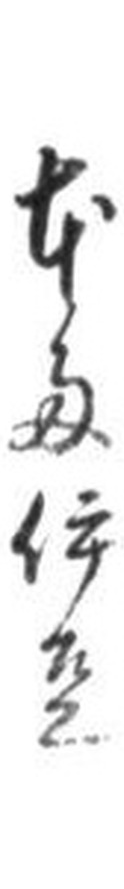本多伊豆
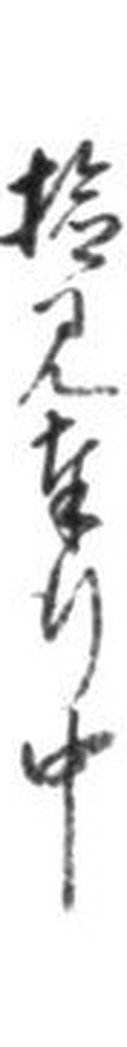検見奉行中
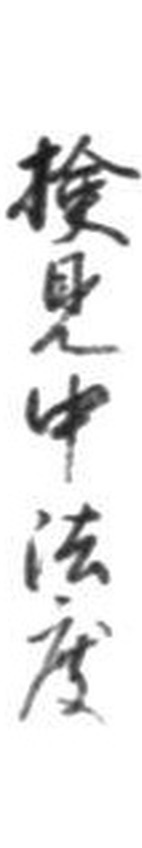検見中法度
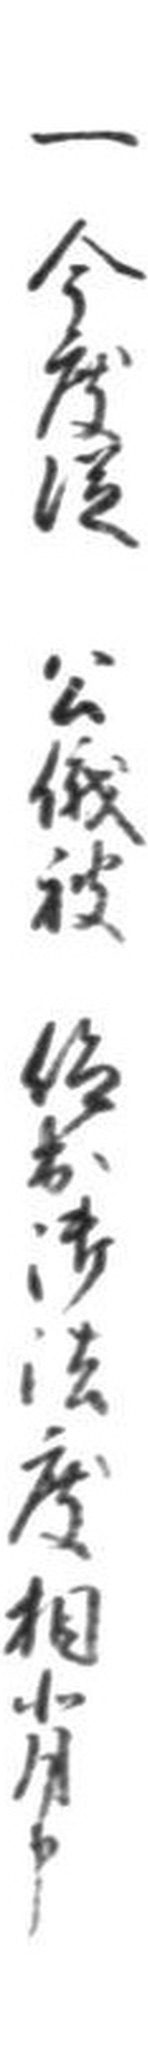一今度従公儀被仰出御法度相背申
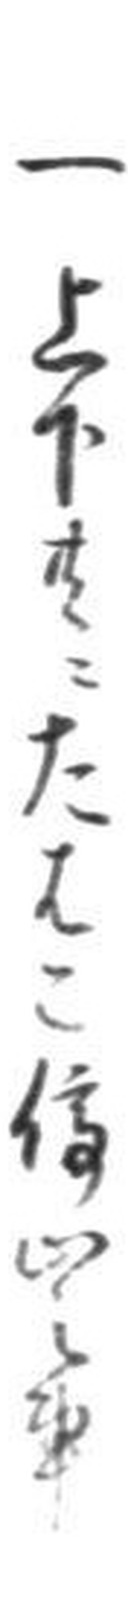一上下共ニたはこ停止之事
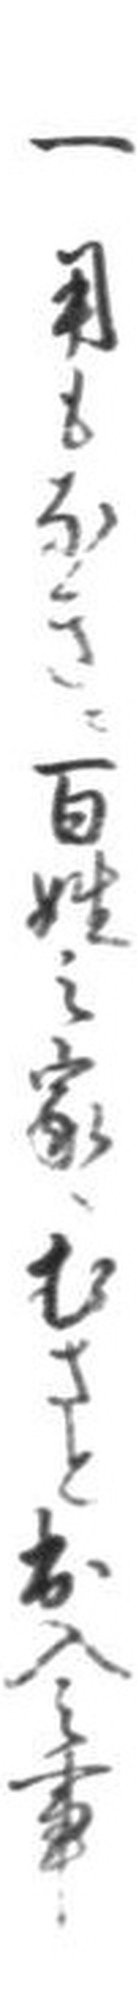一用もなきニ百姓之家ヘむさと出入之事
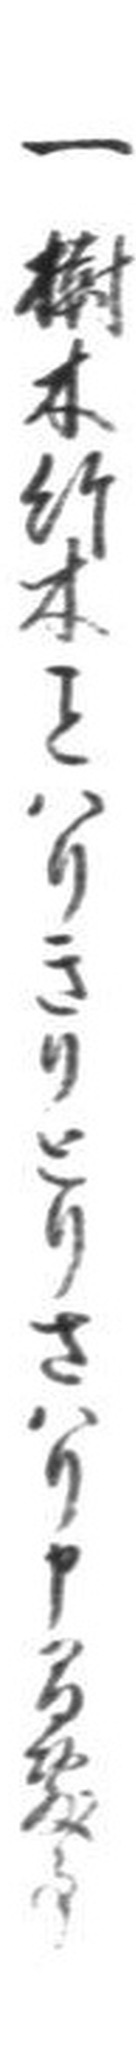一樹木竹木ことはりきりとりさはり申間敷事
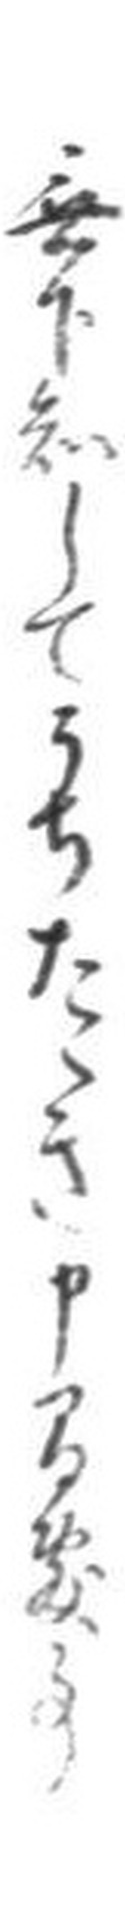無下知してうちたゝき申間敷事
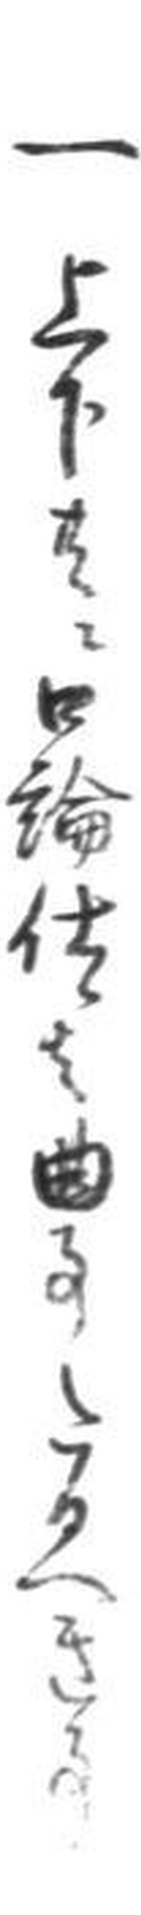一上下共ニ口論仕候は曲事たるへき事
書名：家譜 三 忠昌公 従慶長八年到寛永六年
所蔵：福井県文書館 Fukui Prefectural Archives
